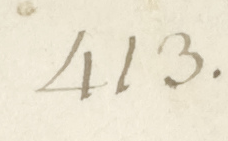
413
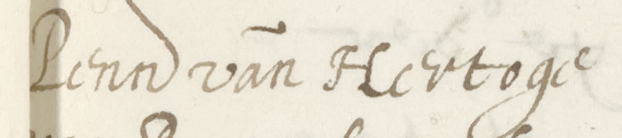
Penn van Hertoge
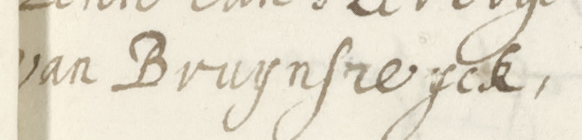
van Bruynswyck
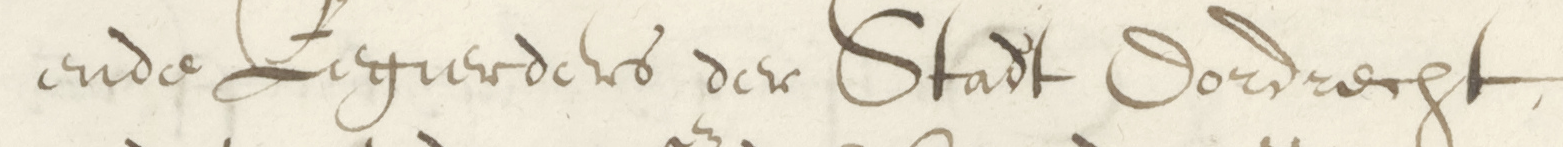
ende Regierders der Stadt Dordrecht,
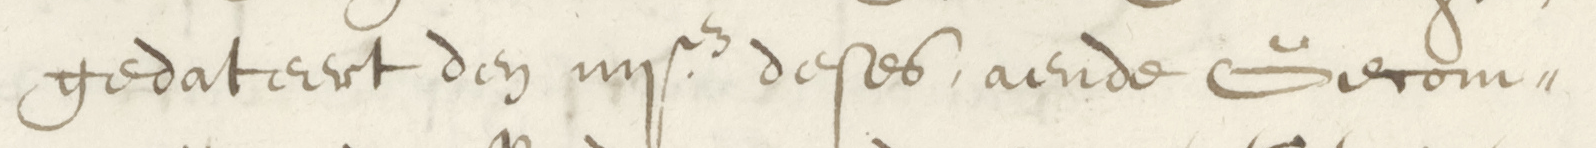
gedateert den iiijen deses, aende Gecom„
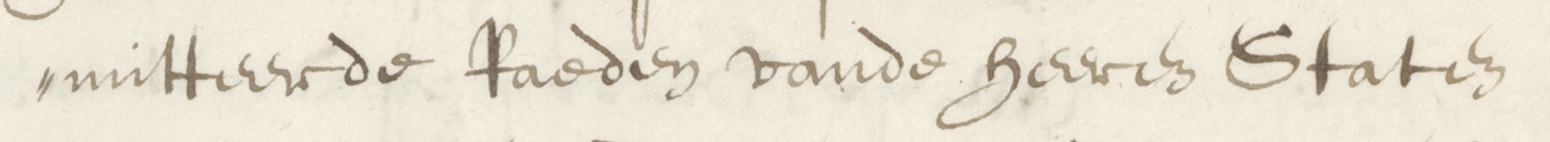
mitteerde Raeden vande heeren Staten
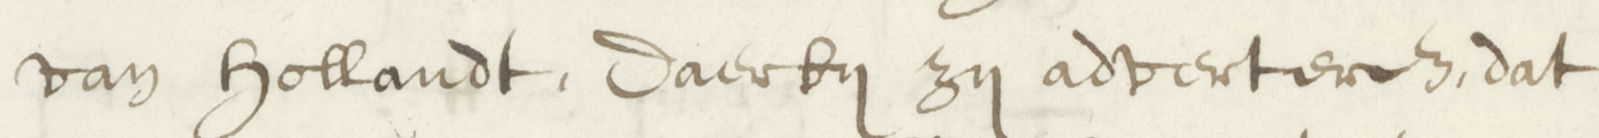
van Hollandt, daerby zij adverteren, dat
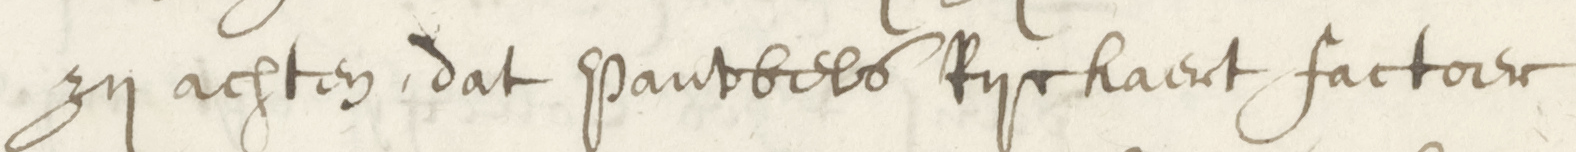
zij achten, dat Pauwels Rijckaert factoer
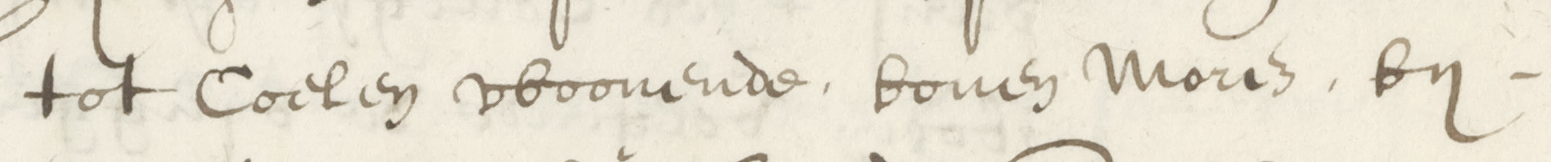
tot Coelen woonende, bouen Moren, by
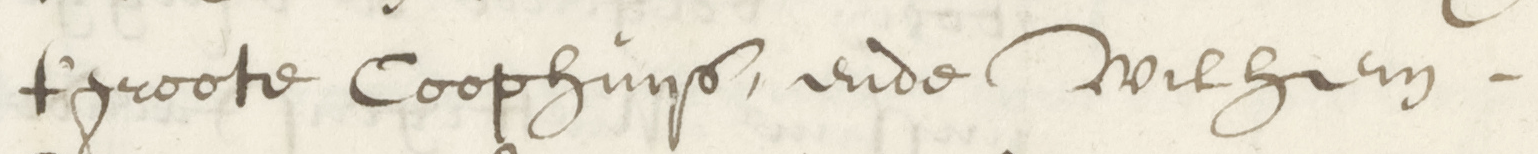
t'groote Coophuys, ende Wilhem
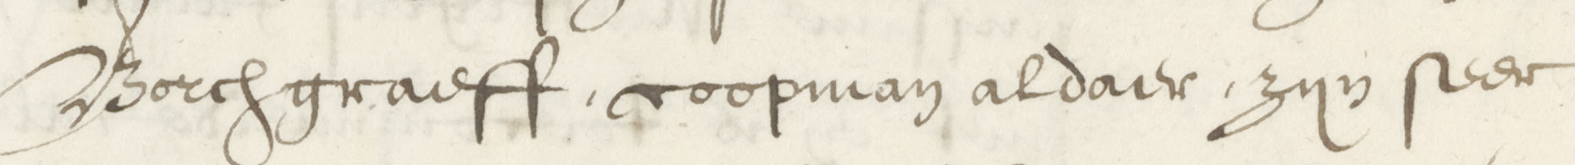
Borchgraeff, coopman aldaer, zyn seer
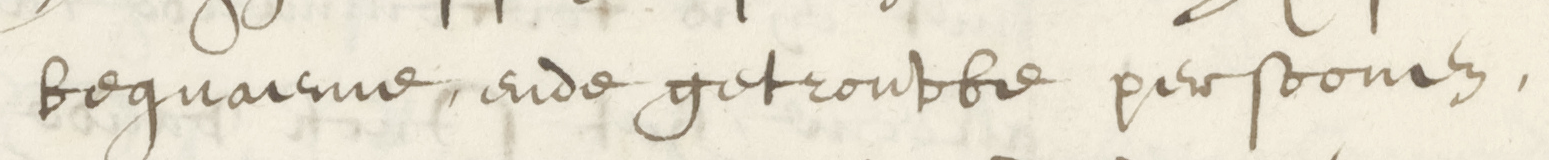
bequaeme, ende getrouwe persoonen,
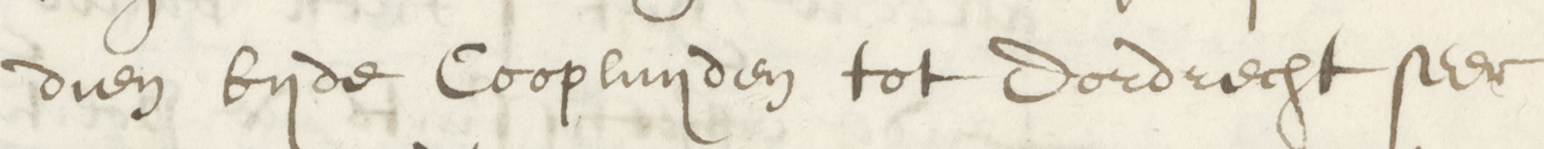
dien bijde Coopluyden tot Dordrecht seer
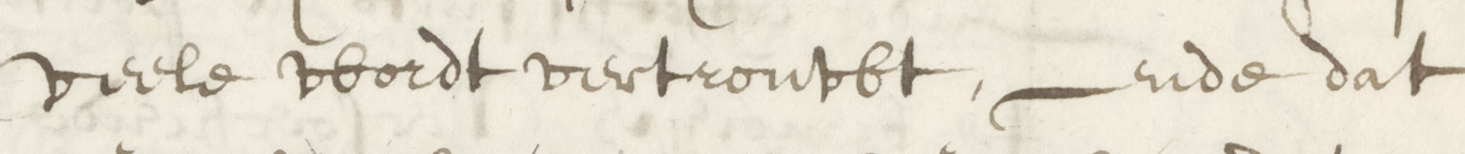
veele wordt vertrouwt, ende dat
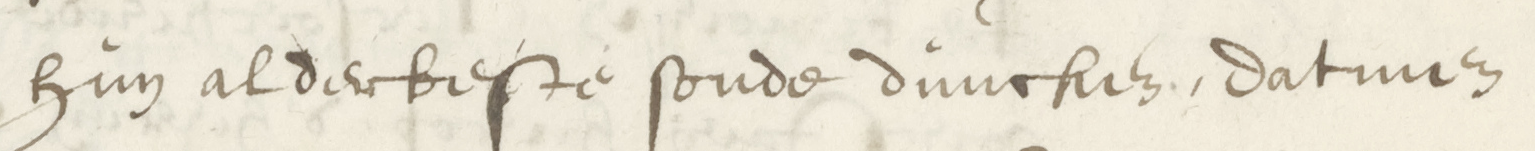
hun alderbeste souden duncken, datmen
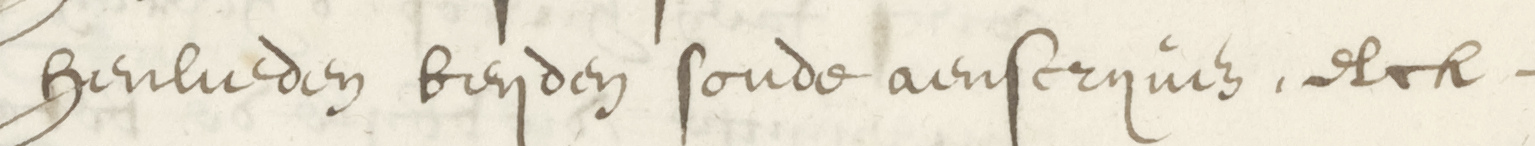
henlieden beyden soude aenscryuen, elck
